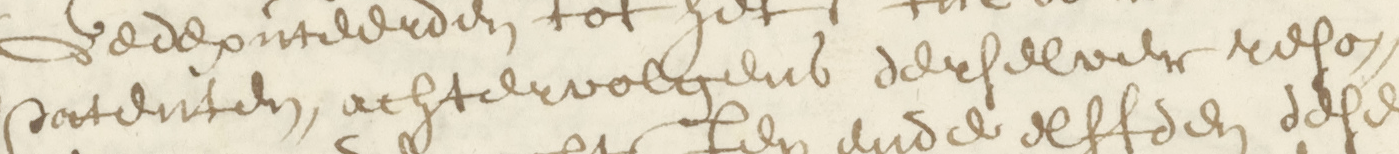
Patenten, achtervolgens derselver reso„
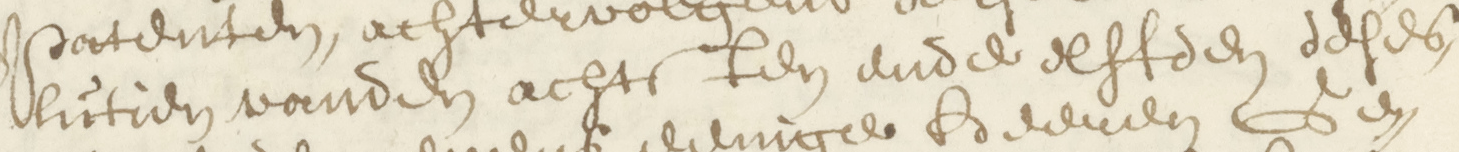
lutien vanden achtsten ende elffden deses,
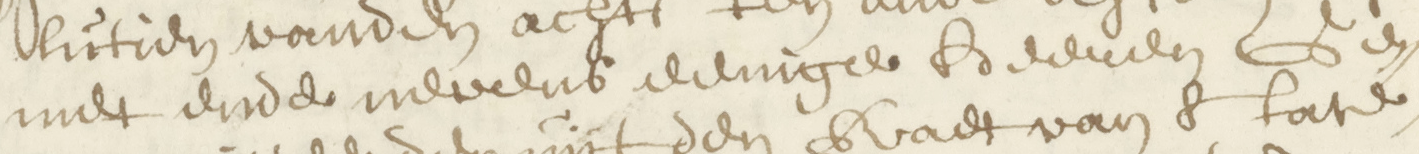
met ende nevens eenige Heeren Ge„
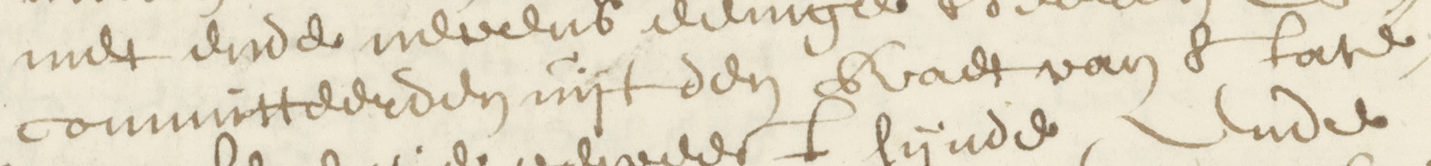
committeerden uijt den Raet van State,
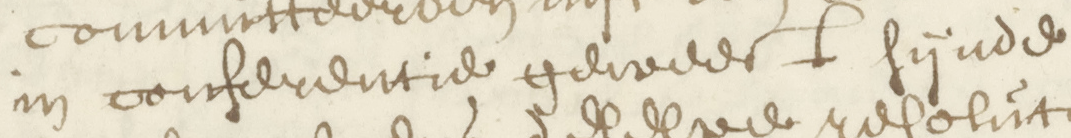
in conferentie geweest sijnde, Ende
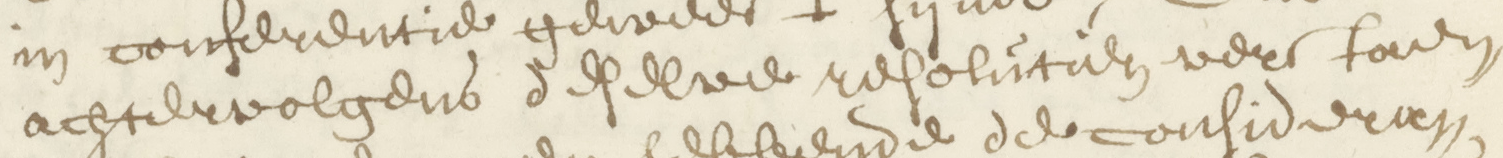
achtervolgens deselve resolutien verstaen,
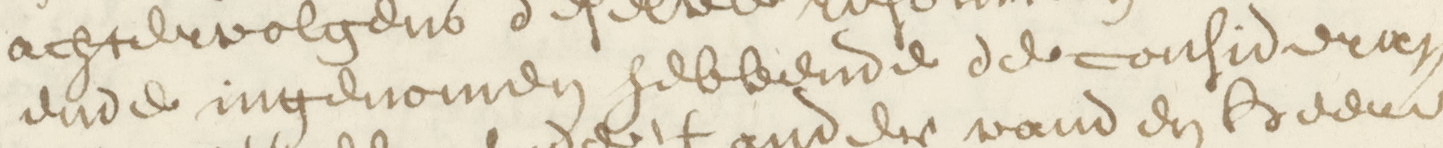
ende ingenomen hebbende de considera„
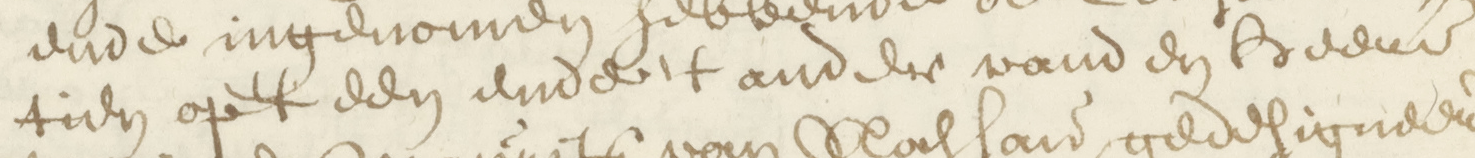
tien op‛t een ende 't ander vanden Heere
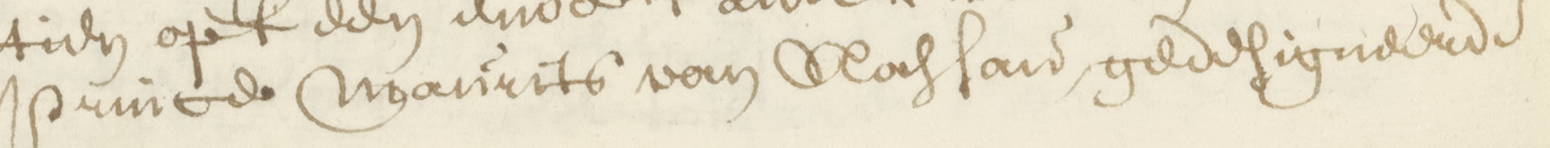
Prince Maurits van Nassau, gedesigneerd
